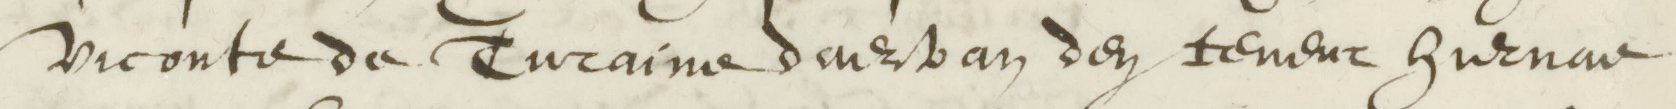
Viconte de Turaine daervan den teneur hiernae
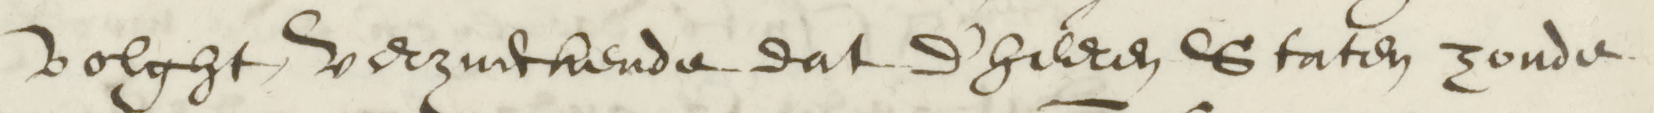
volght, verzueckende dat d'heeren Staten zoude
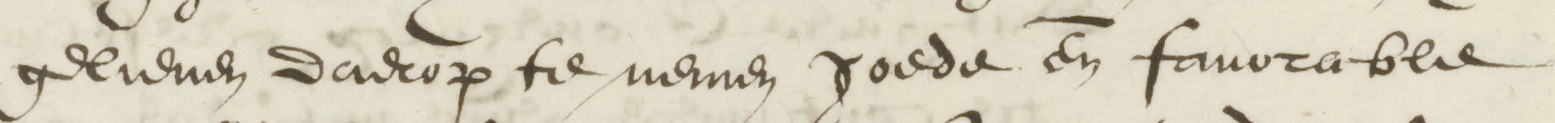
gelieuen daerop te nemen goede en fauorable
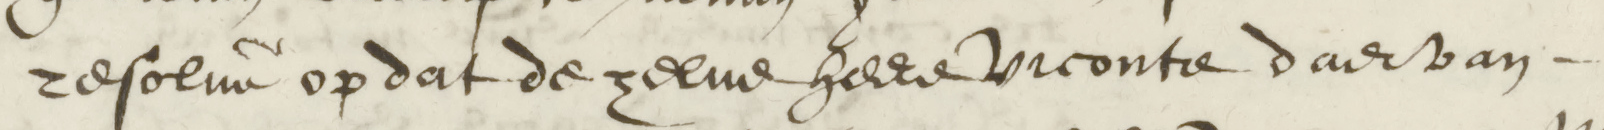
resolue op dat de zelue heere Viconte daervan -
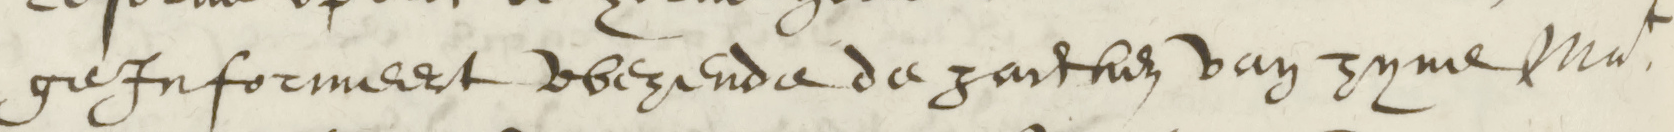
geInformeert wezende de zaecken van zyne Mat.
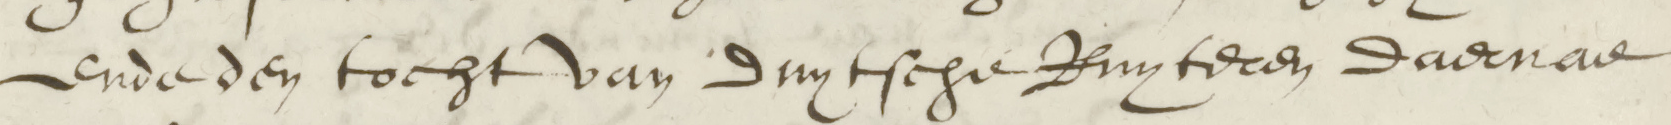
ende den tocht van Duytsche Ruyteren daernae
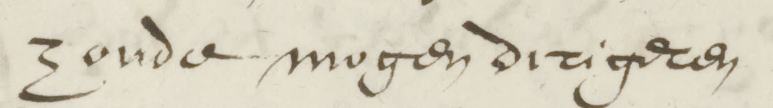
zoude mogen dirigeren
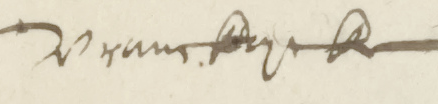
Vranckryck
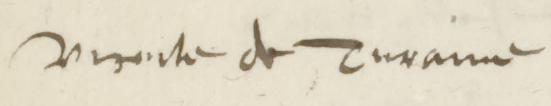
Viconte de Turaine
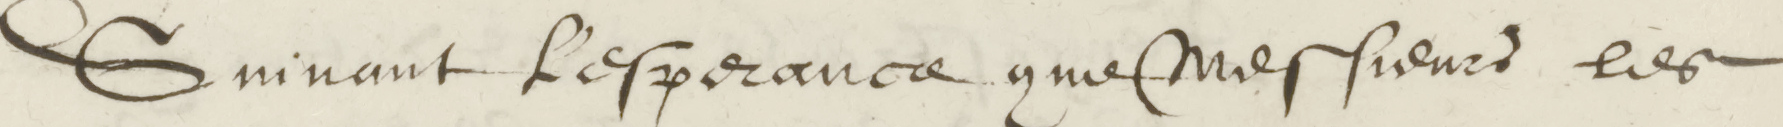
Suiuant L' esperance que Messieurs les
